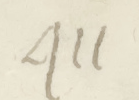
411
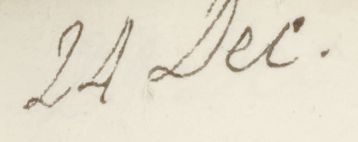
24 Dec.
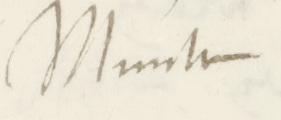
Munte
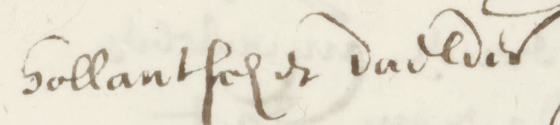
hollantschen daelder
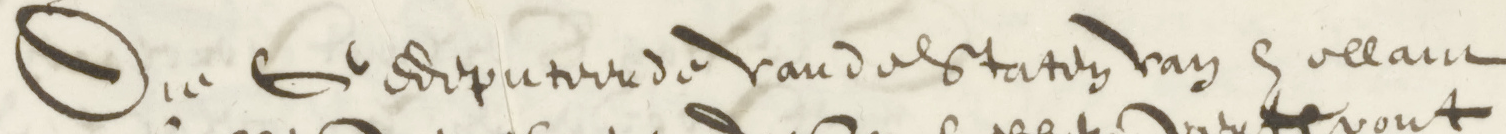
Die Gedeputeerde van de Staten van Hollant
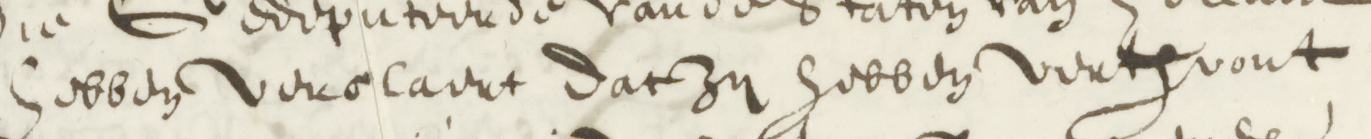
hebben verclaert dat zy hebben verthrout
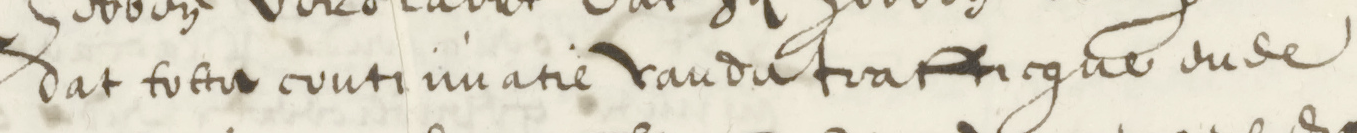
dat totte continuatie vande trafficque ende
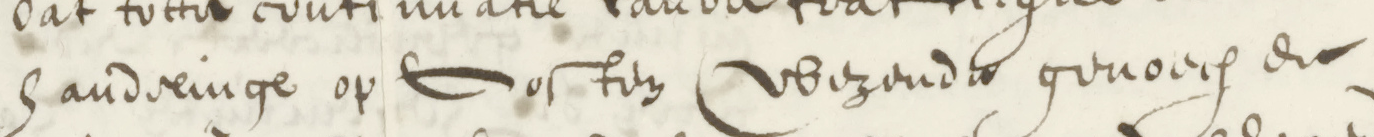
handelinge op Oosten (wezende genoech de
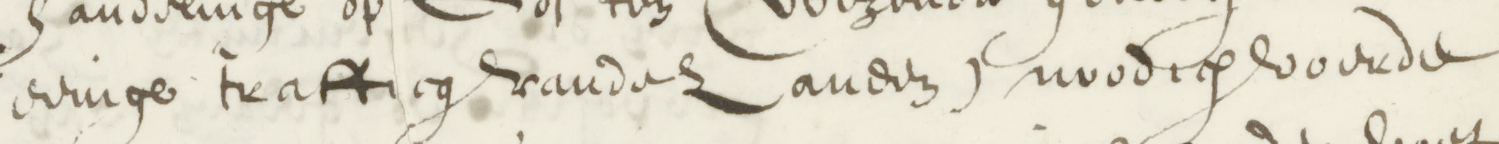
eenige trafficq vande Landen) noodich voerde
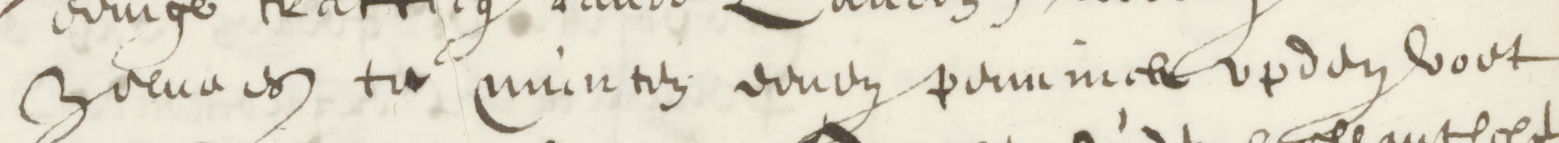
zelue es te munten eenen penninck upden voet
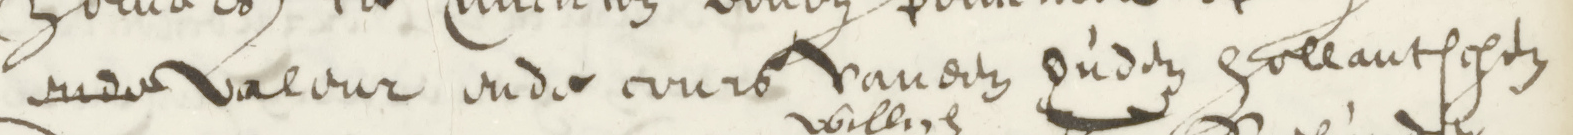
ende valeur ende cours vanden ouden hollantschen
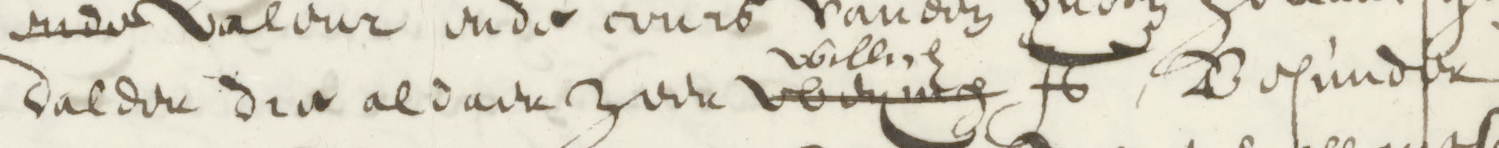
dalder die aldaer zeer weynich willich is, Besunder
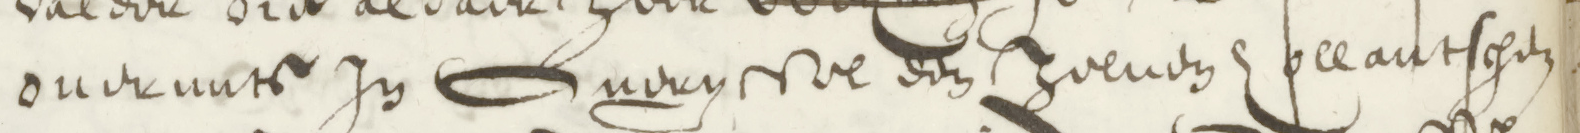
ouermits in Overijssel een zelven hollantschen
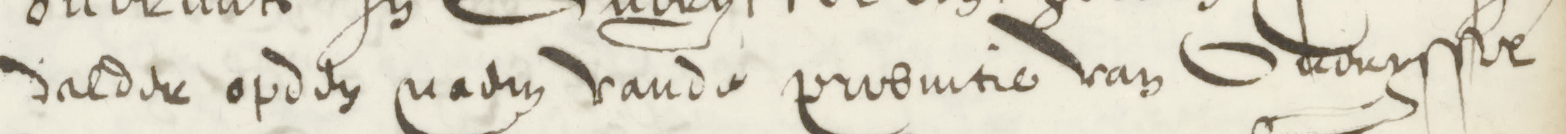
dalder opden naem vande provintie van Oueryssel
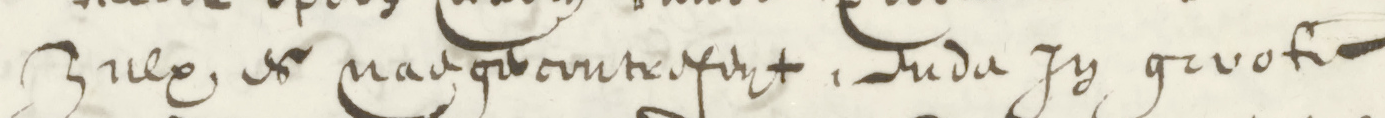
zulx es naegeconterfeyt, ende in groote
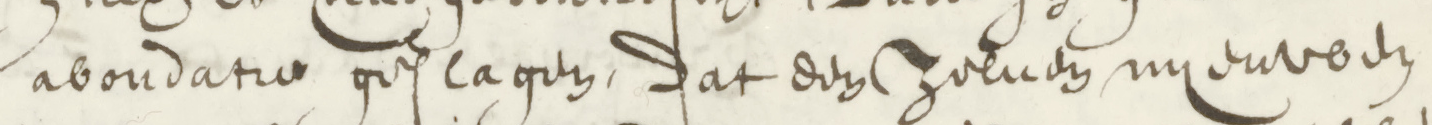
abondatie geslagen, dat den zeluen nyeuwen
